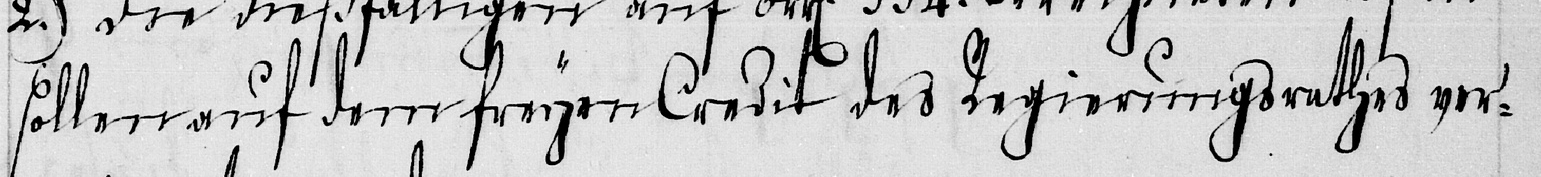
sollen auf dem freyen Credit des Regierungsrathes ver¬
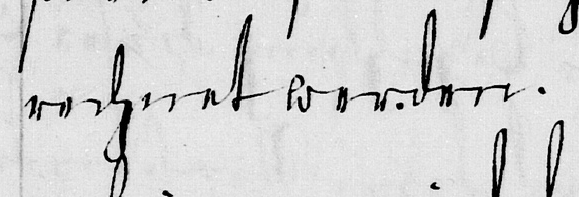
rechnet werden.
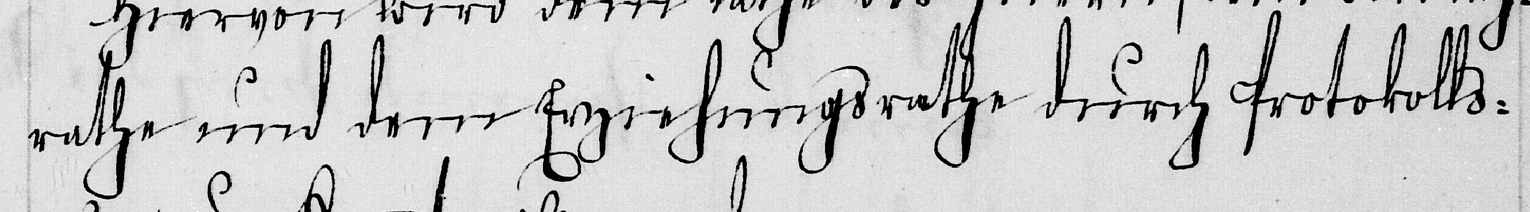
rathe und dem Erziehungsrathe durch Protokolls¬
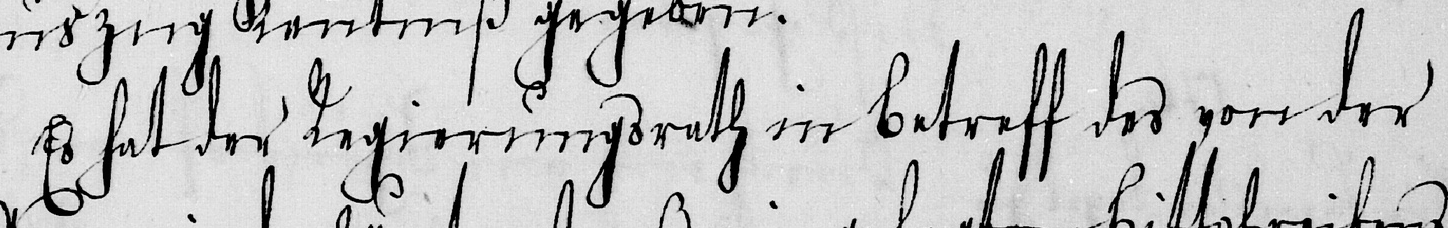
Es hat der Regierungsrath in Betreff des von der
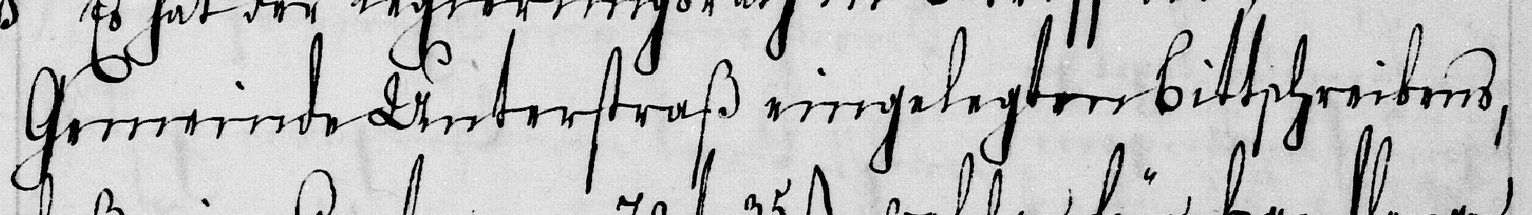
Gemeinde Unterstraß eingelegten Bittschreibens,
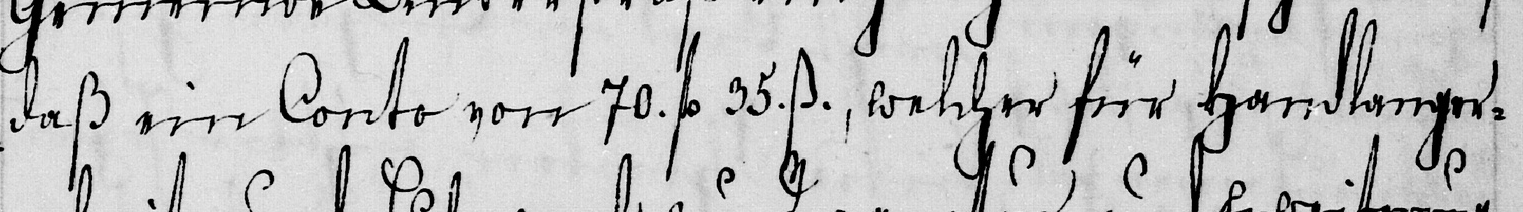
daß ein Conto von 70. fl. 35. ß., welcher für Handlanger¬
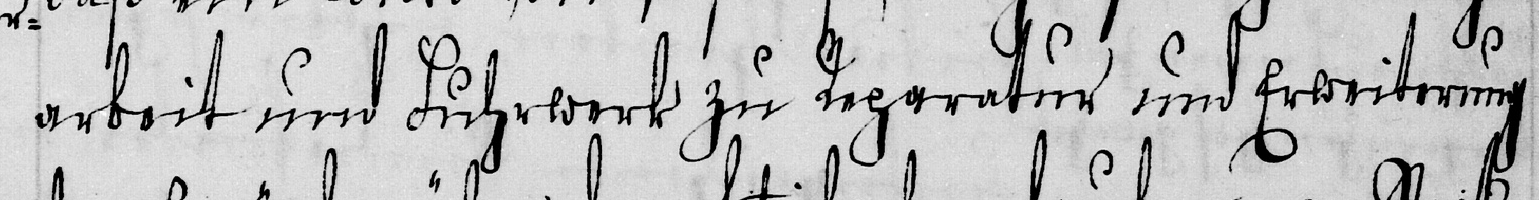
arbeit und Fuhrwerk zu Reparatur und Erweiterung
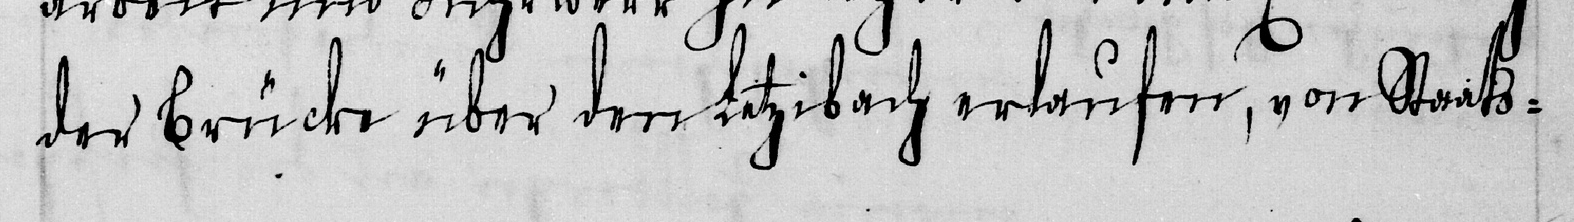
der Brücke über den Letzibach erlaufen, von Staats-
